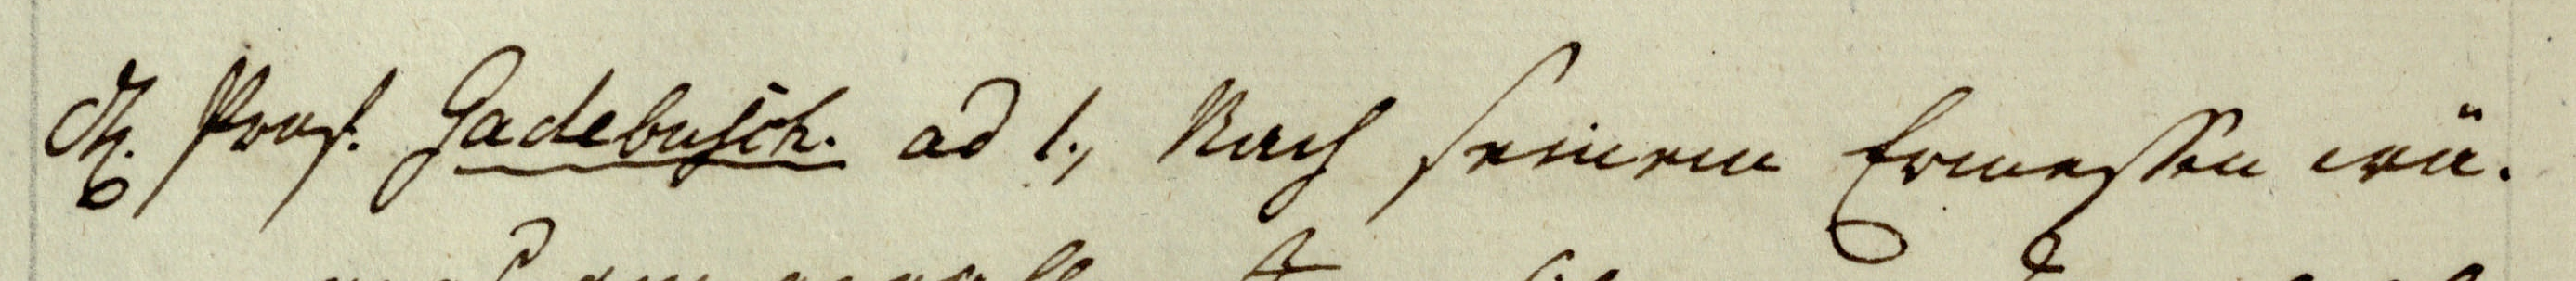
dh. Prof. Gadebusch. ad 1., Nach seinem Ermessen wä¬
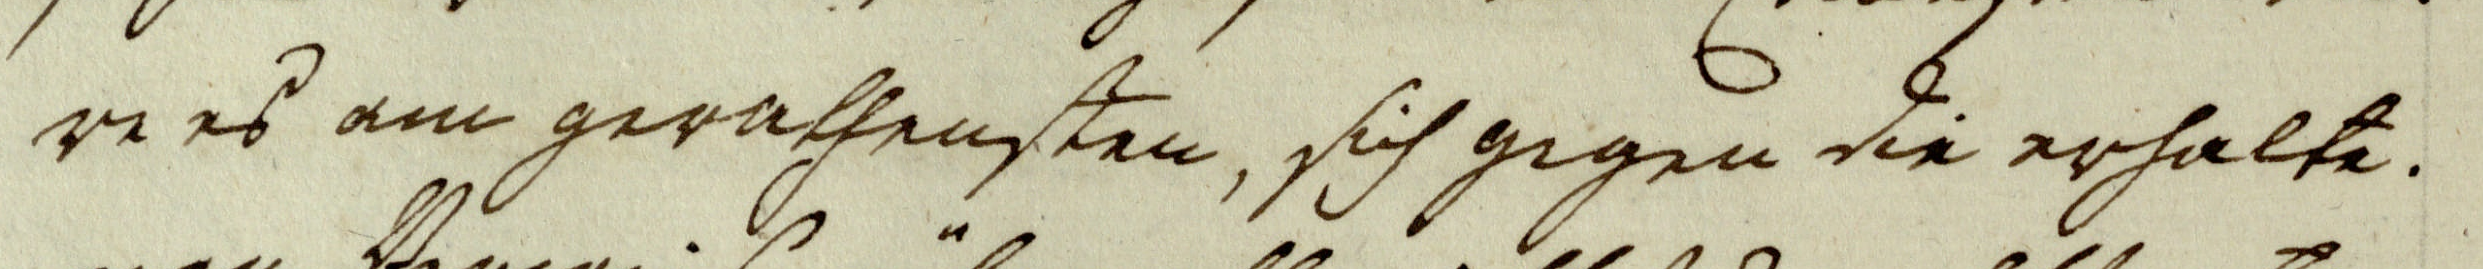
re es am gerathensten, sich gegen die erhalte¬
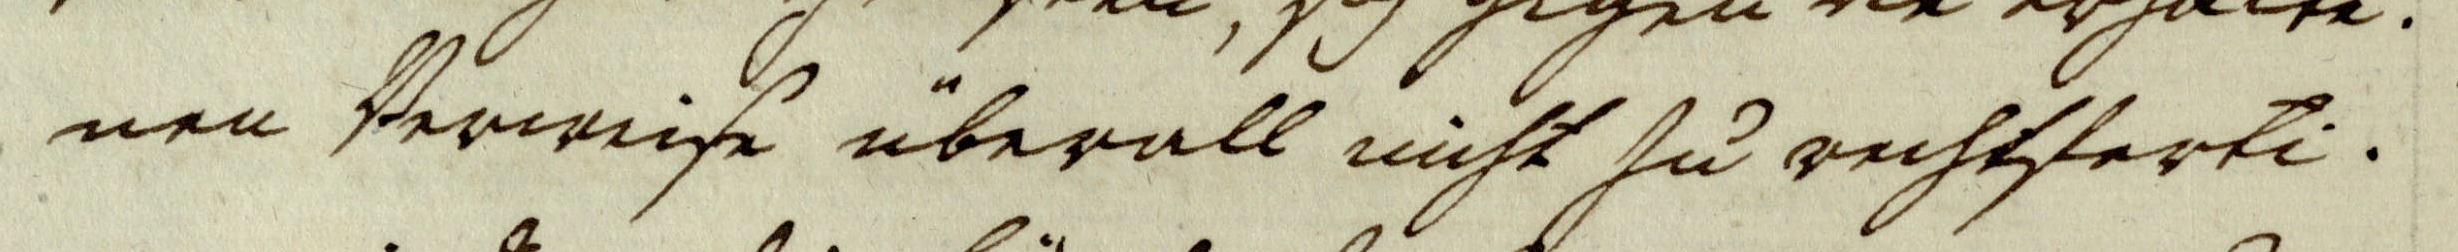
nen Verweise überall nicht zu rechtferti¬
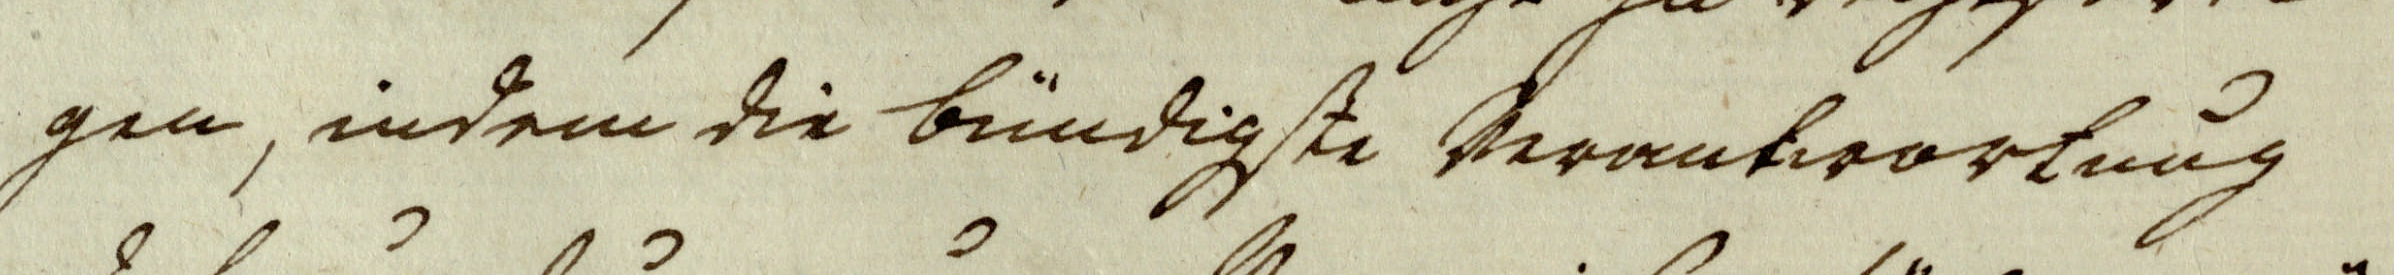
gen, indem die bündigste Verantwortung
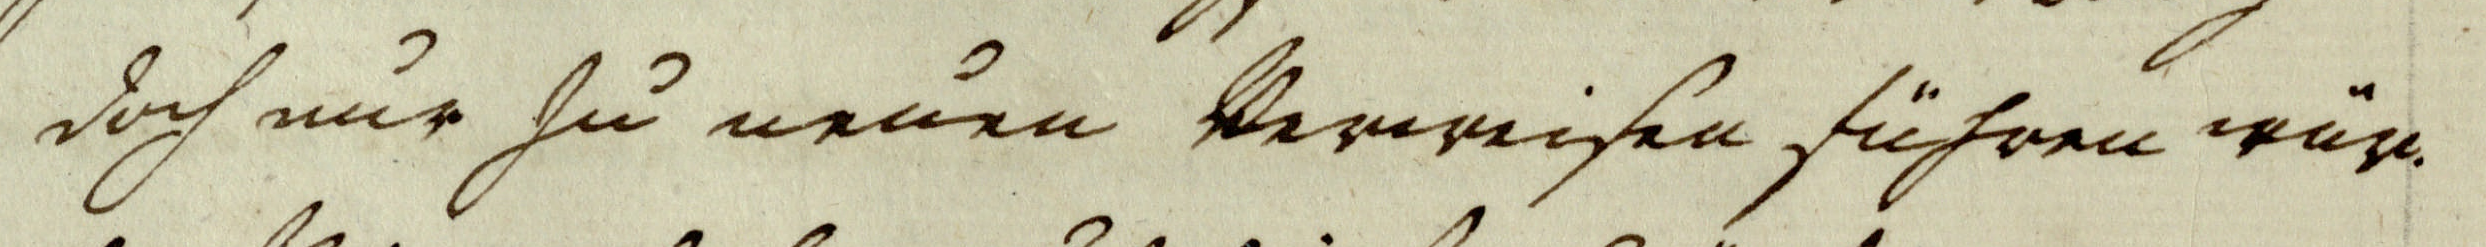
doch nur zu neuen Verweisen führen wür¬
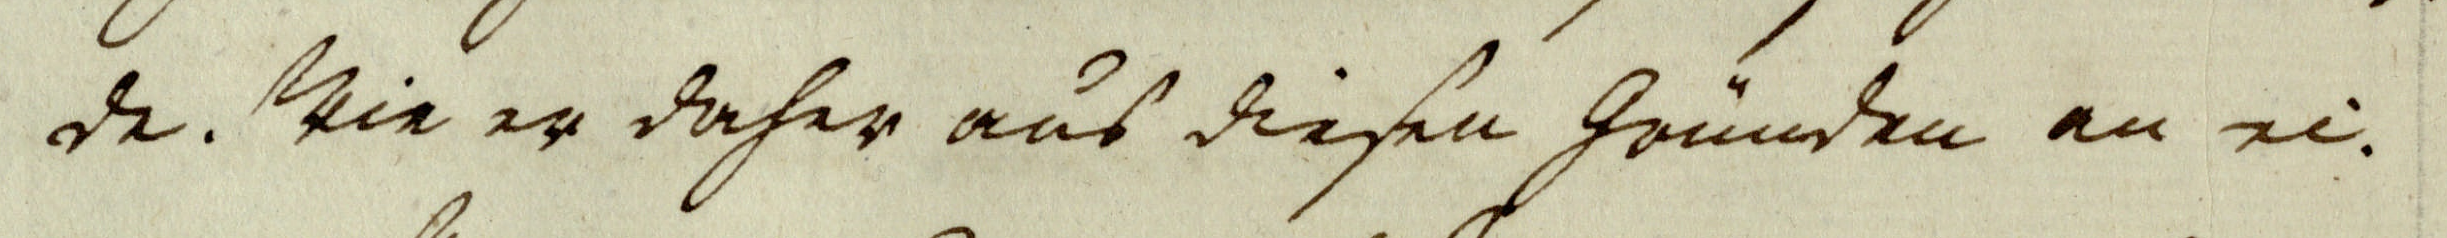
de. Wie er daher aus diesen Gründen an ei¬
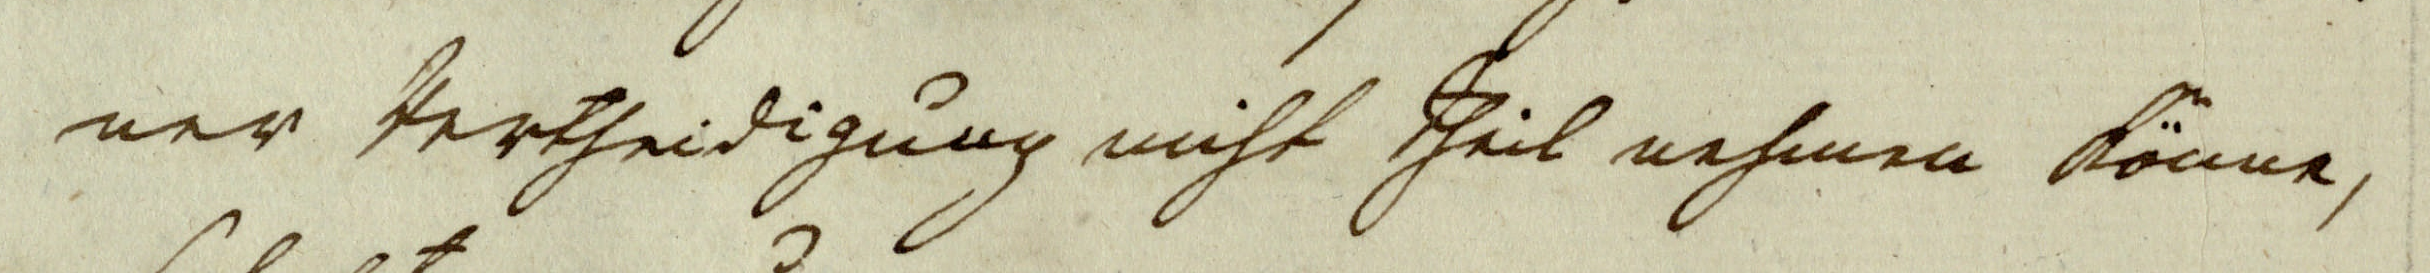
er Vertheidigung nicht Theil nehmen könne,
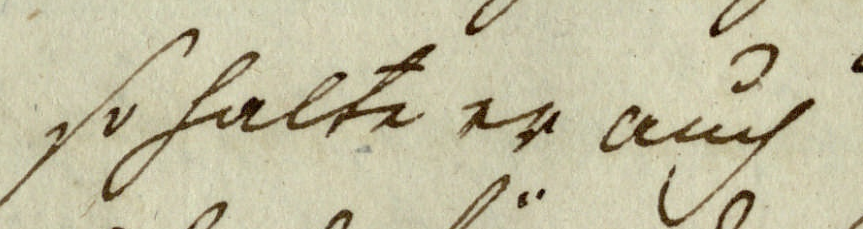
so halte er auch
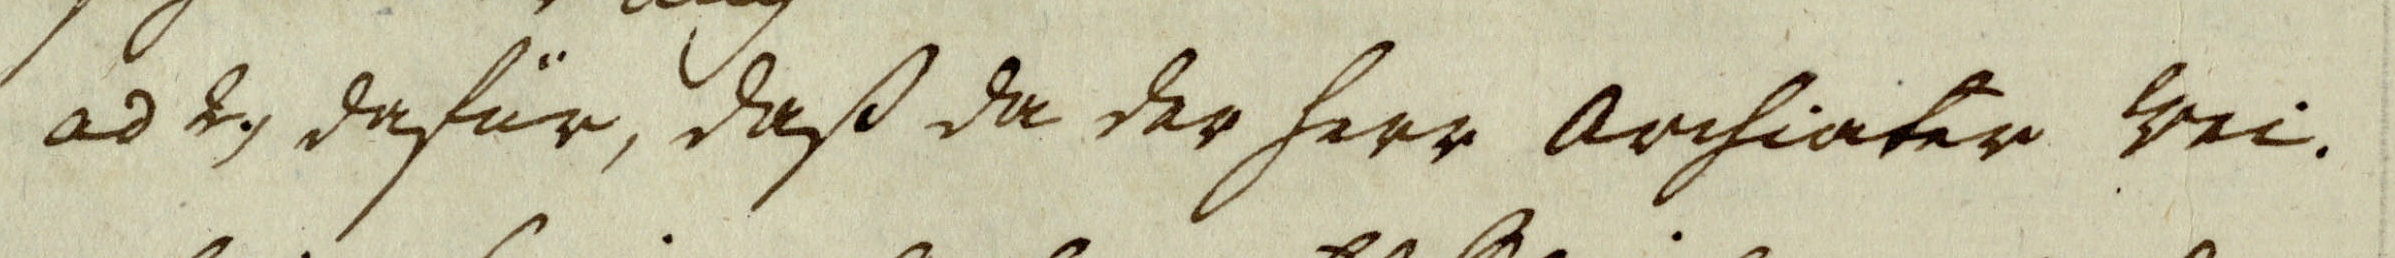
ad 2., dafür, daß da der Herr Archiater Wei¬
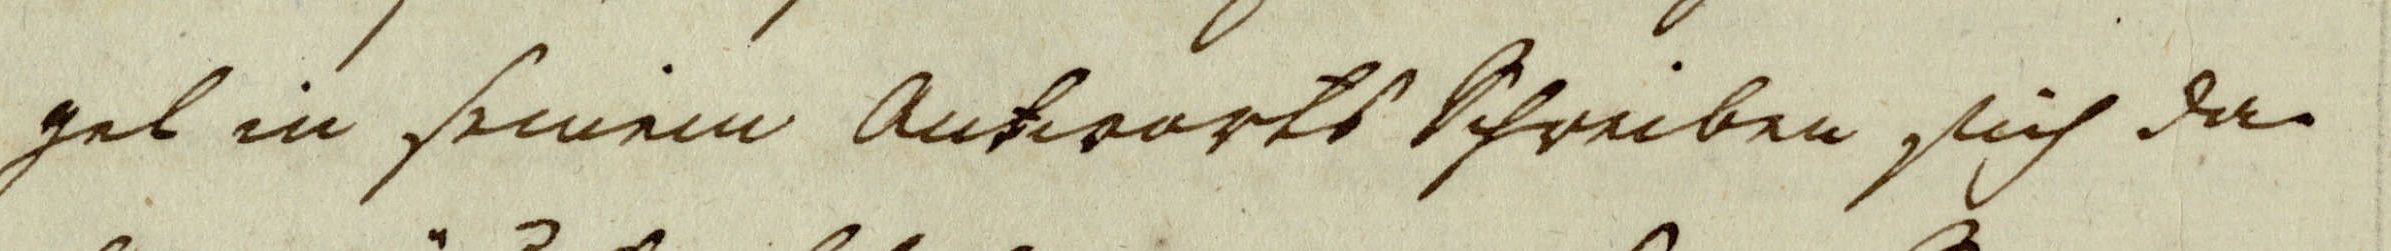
gel in seinem Antworts Schreiben sich da¬
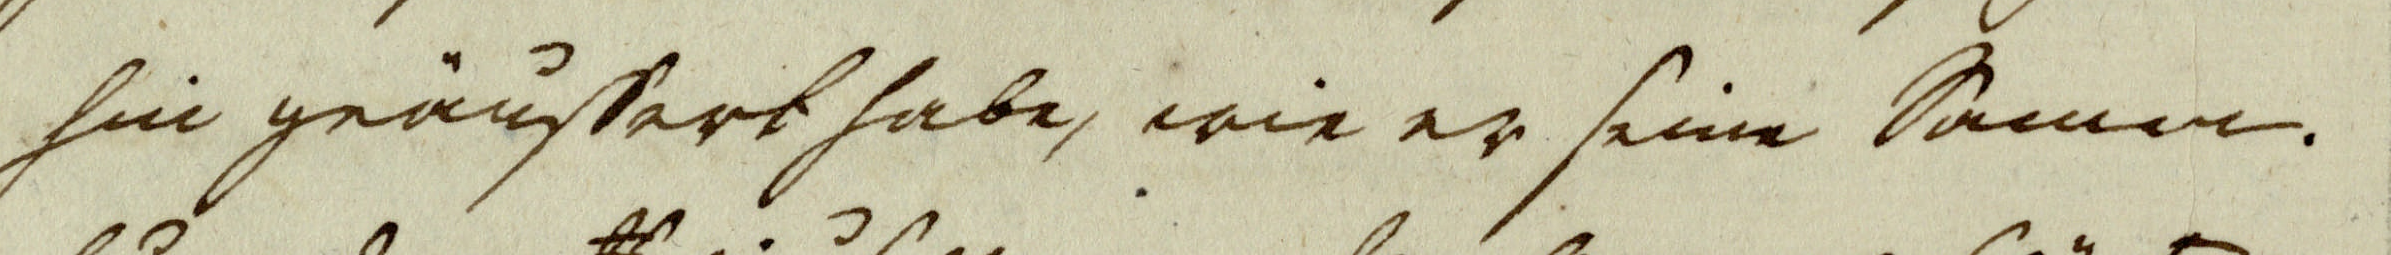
hin geäussert habe, wie er seine Samm¬
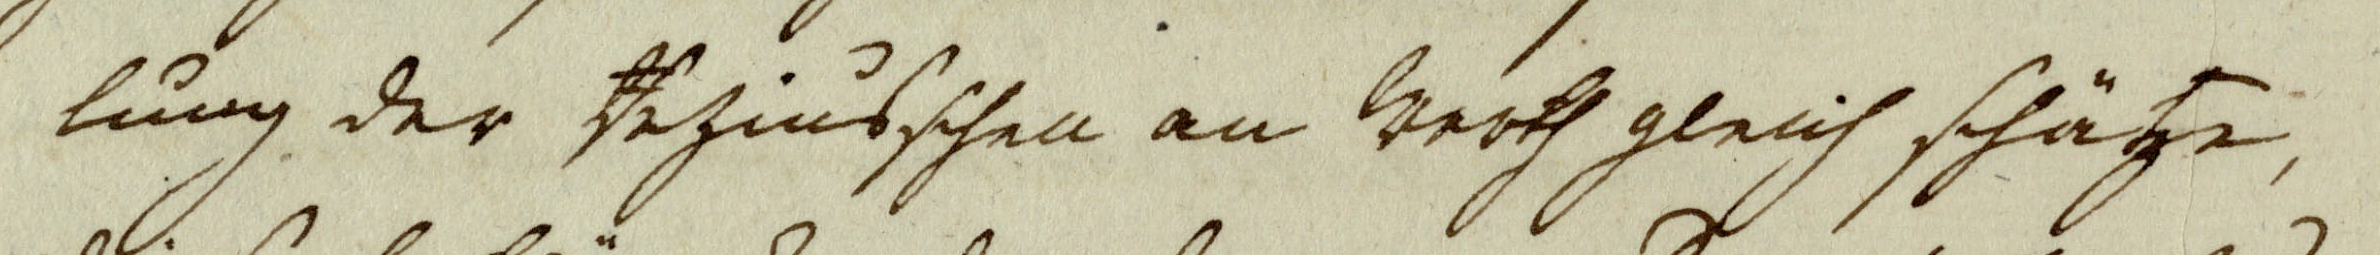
lung der Reziusschen an Werth gleich schätze,
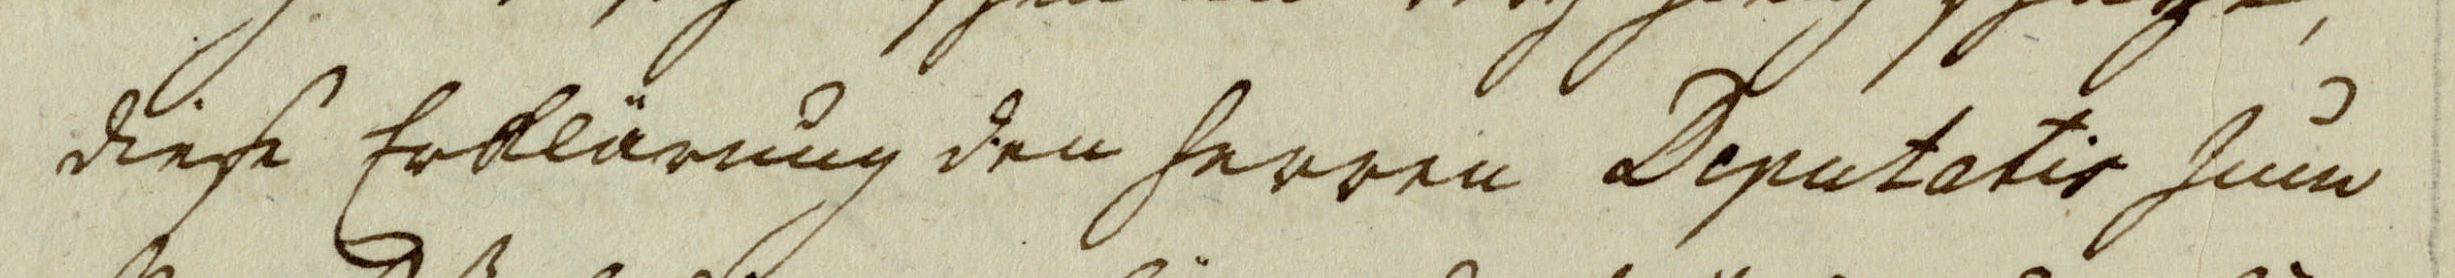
diese Erklärung den Herren Deputatis zum
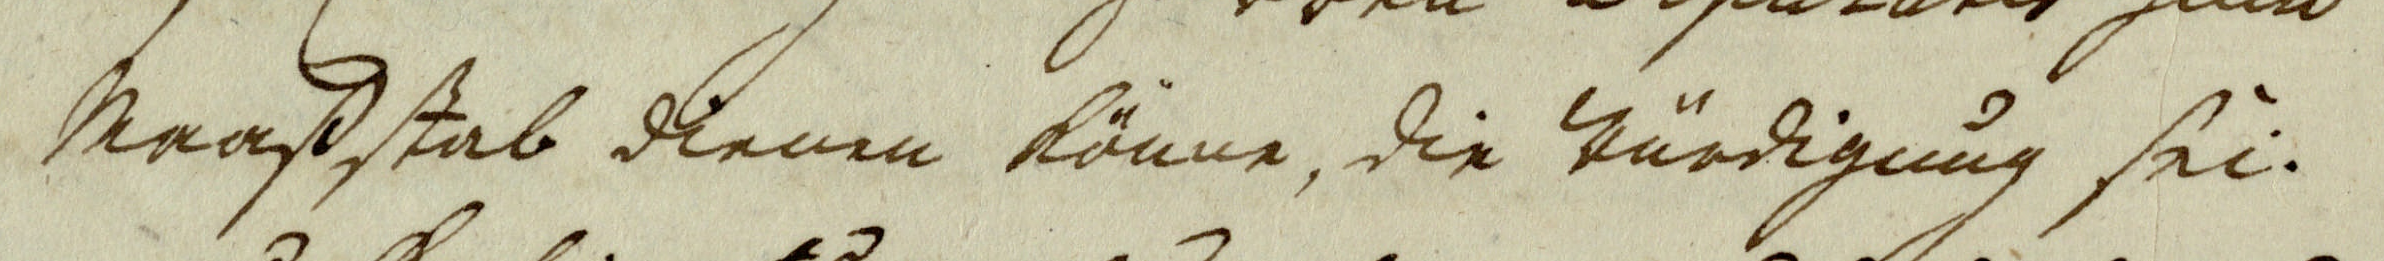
Maaßstab dienen könne, die Wardigung sei¬
